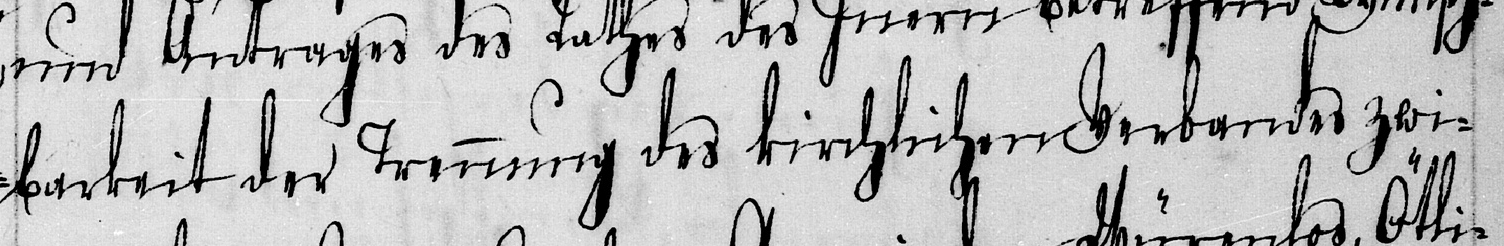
barkeit der Trennung des kirchlichen Verbandes zwis¬
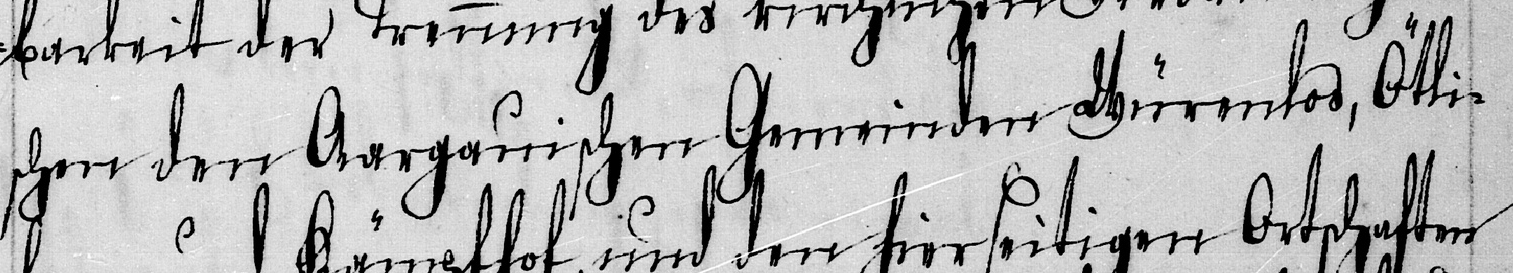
chen den Aargauischen Gemeinden Würenlos, Ötli¬
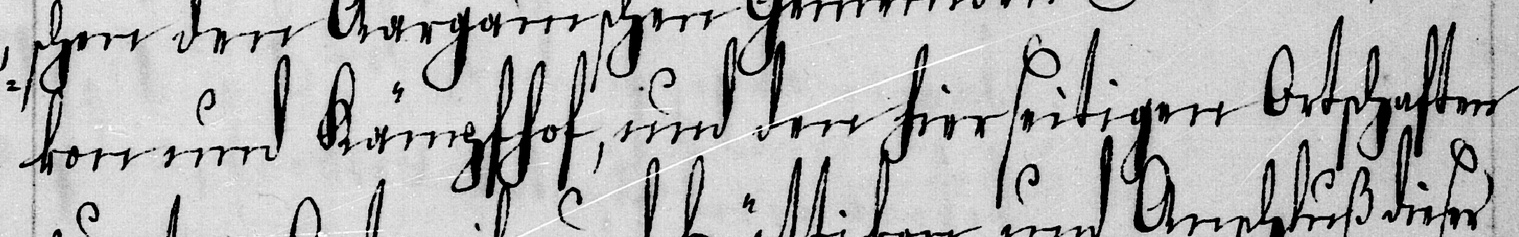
kon und Kämpfhof, und den hierseitigen Ortschaft¬
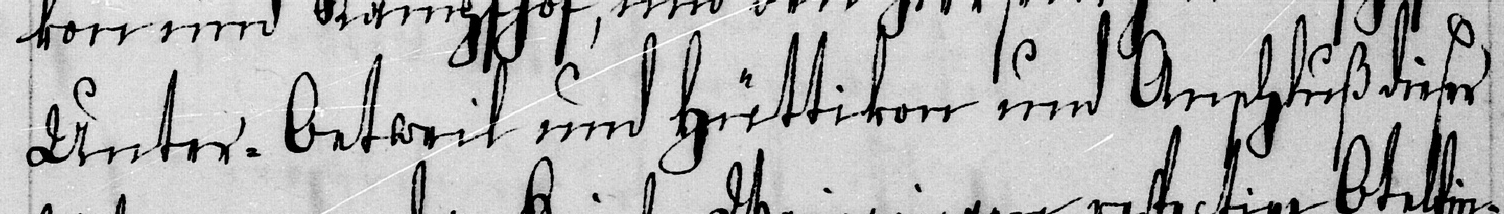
Unter-Oetweil und Hüttikon und Anschluß dieser
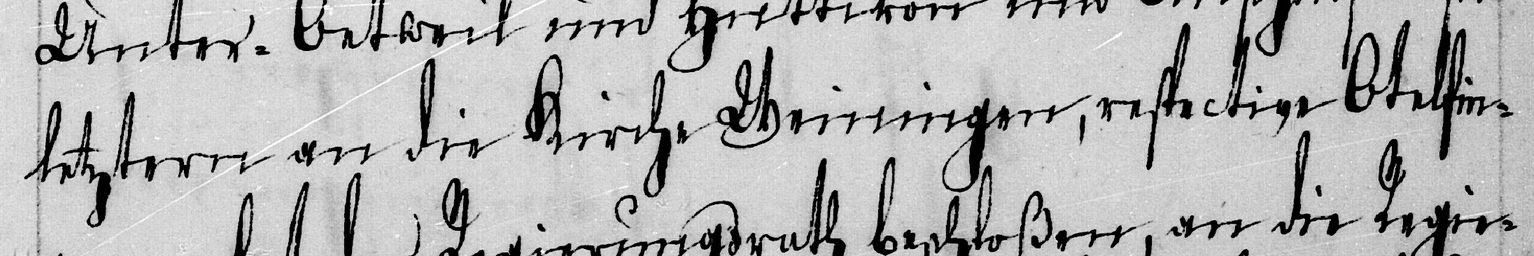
letztern an die Kirche Weiningen, respective Otelfin¬
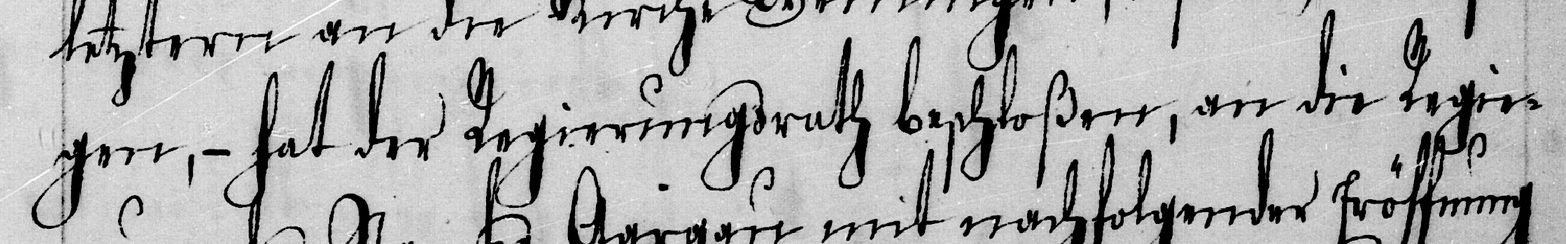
gen, – hat der Regierungsrath beschloßen, an die Regie¬
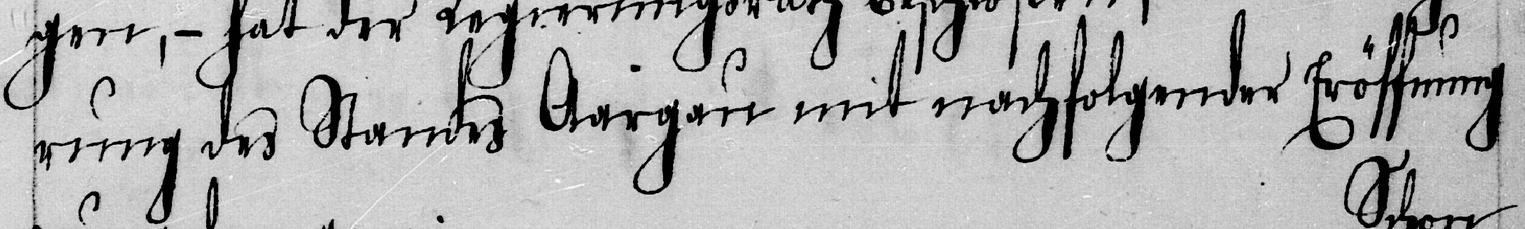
rung des Standes Aargau mit nachfolgender Eröffnung
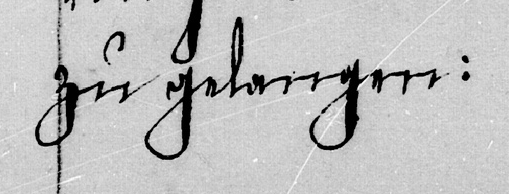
zu gelangen:
